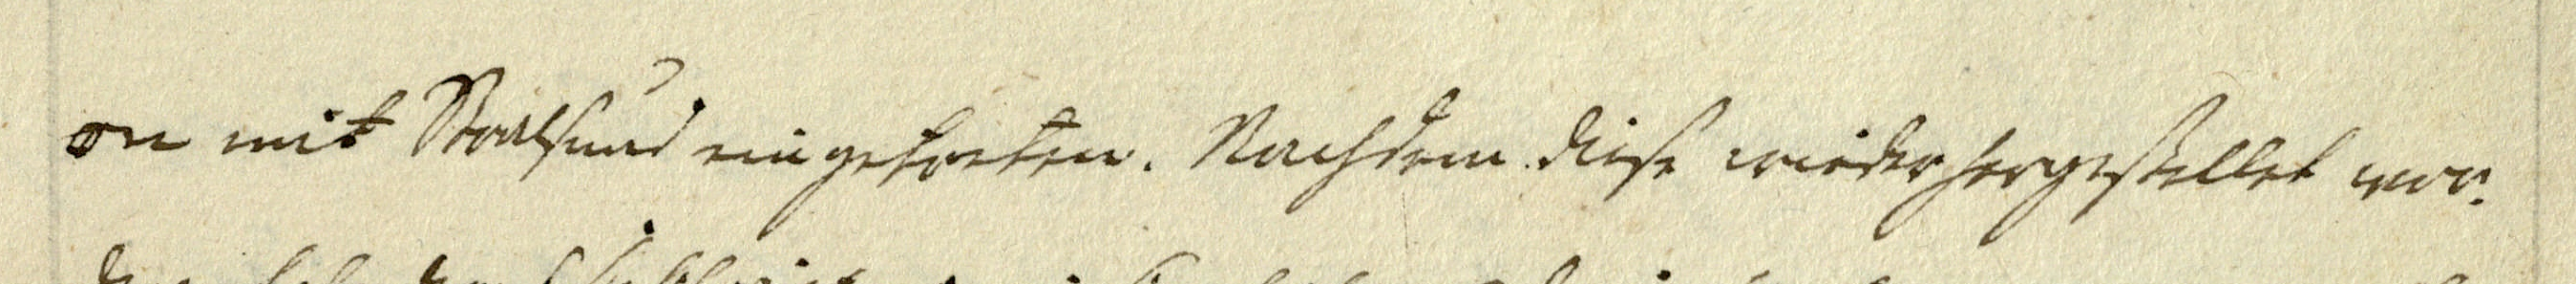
on mit Stralsund eingetreten. Nachdem diese wiederhergestellet wor¬
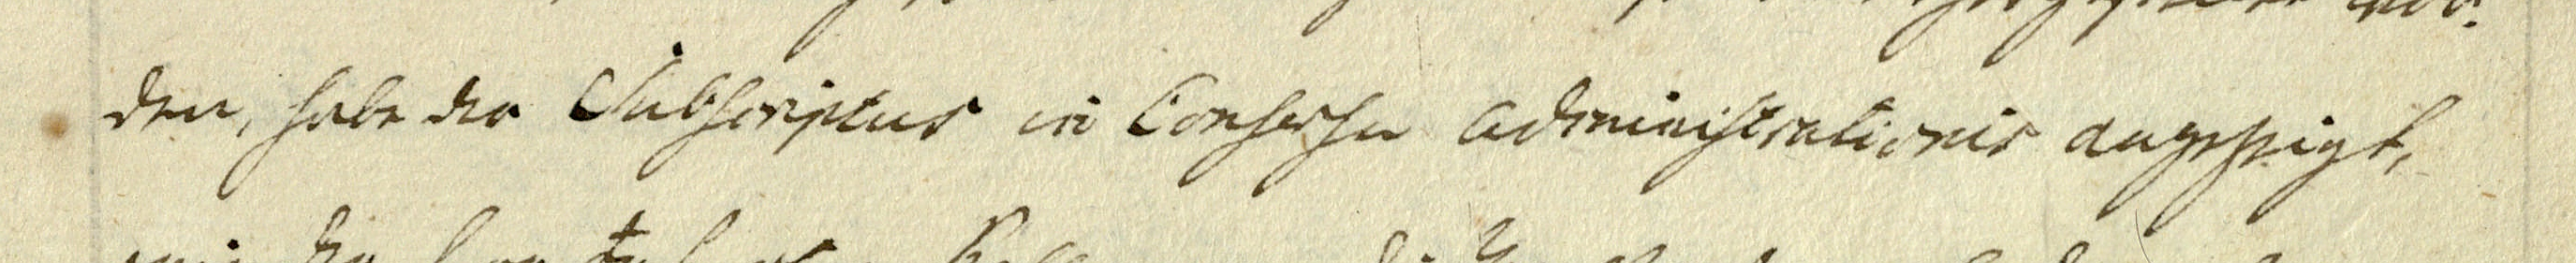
den, habe der Subscriptus in Consessu Administrationis angezeigt,
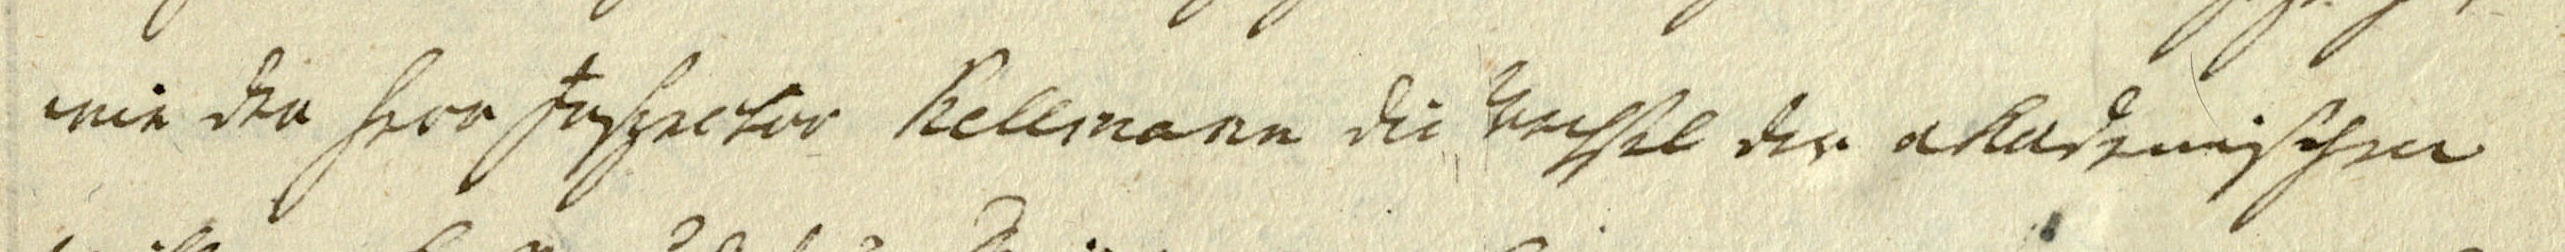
wie der Herr Inspector Kellmann die Wechsel der akademischen
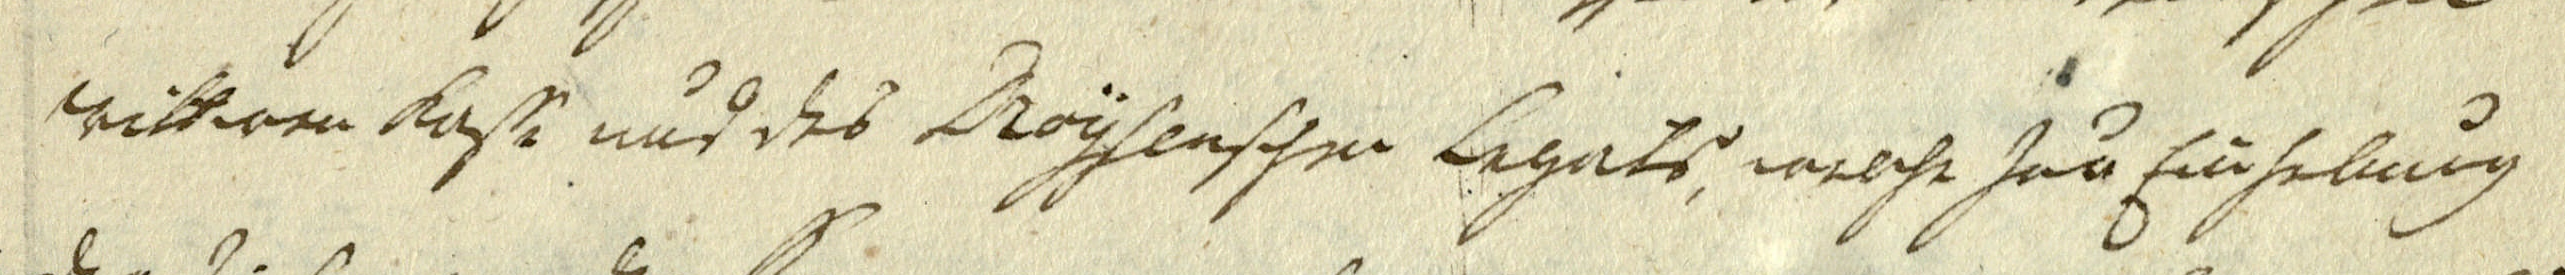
Wittwen Kasse und des Droÿsenschen Legats, welche zur Einhebung
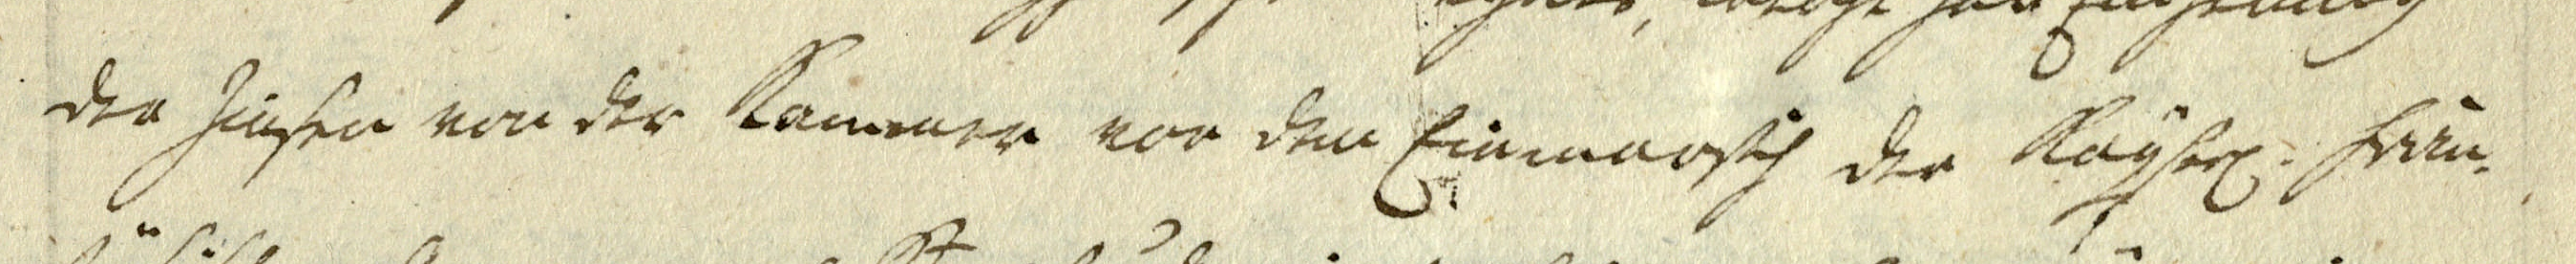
der Zinsen von der Kammer vor den Einmarsch der Kaÿserl. Fran¬
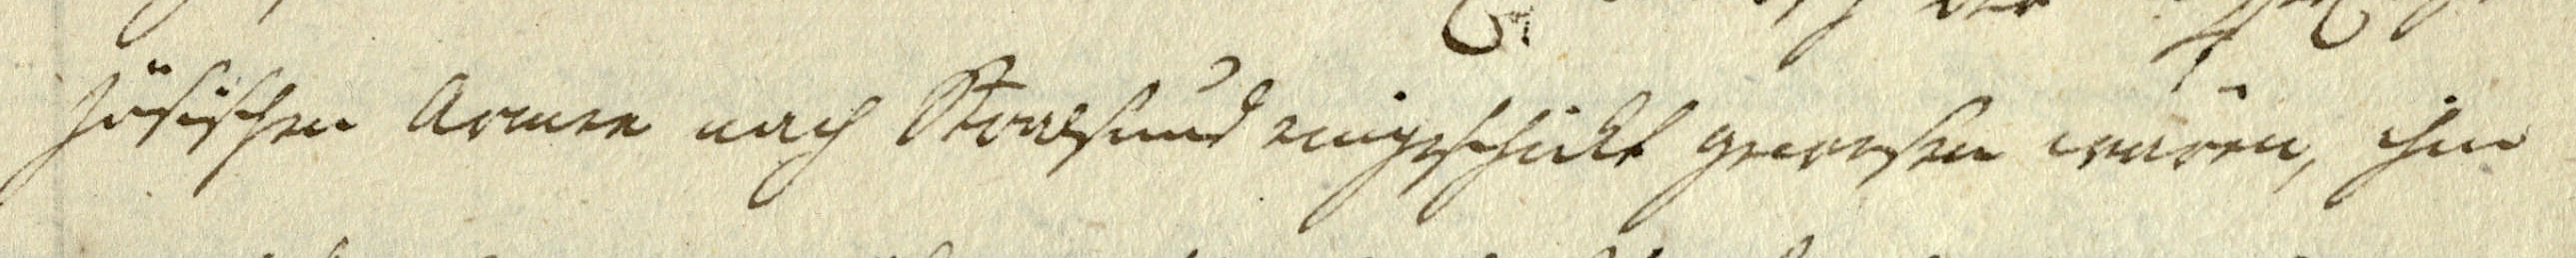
zösischen Armee nach Stralsund engeschickt gewesen wären, ihm
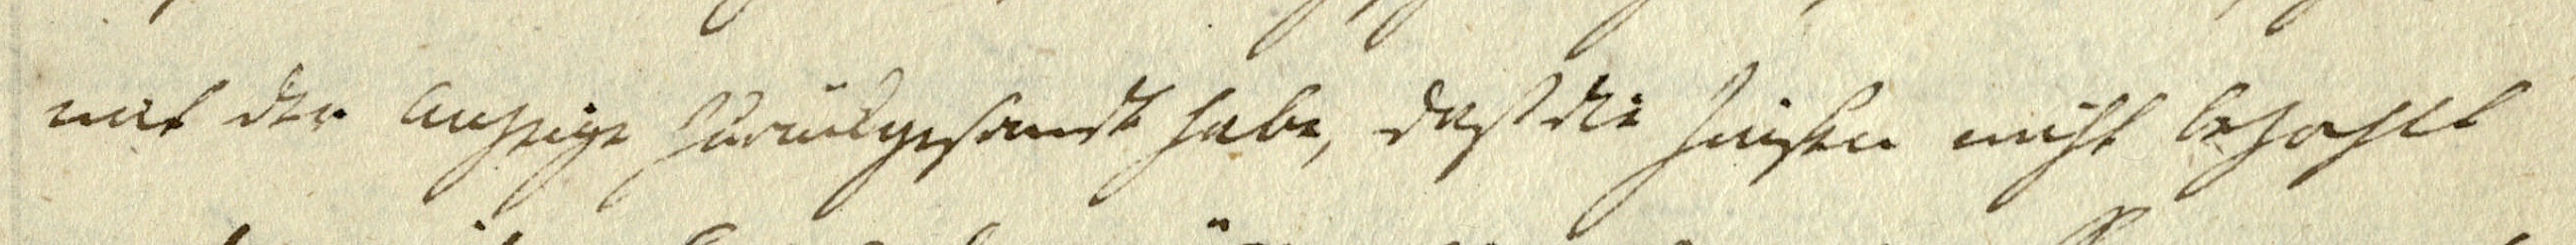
mit der Anzeige zurückgesandt habe, daß die Zinsen nicht bezahlt
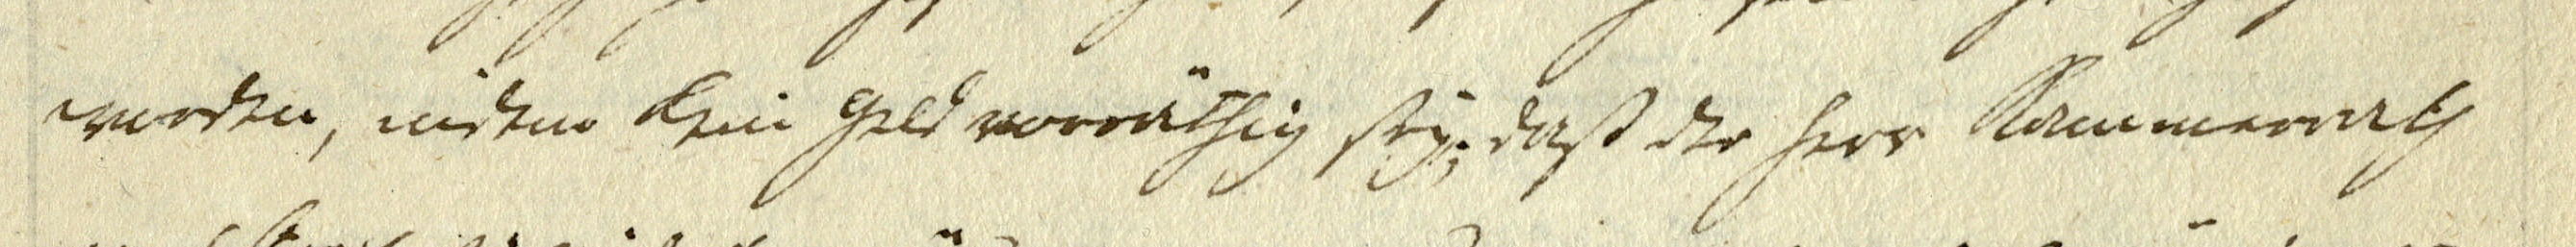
werden, indem kein Geld vorräthig seÿ, daß der Herr Kammerrath
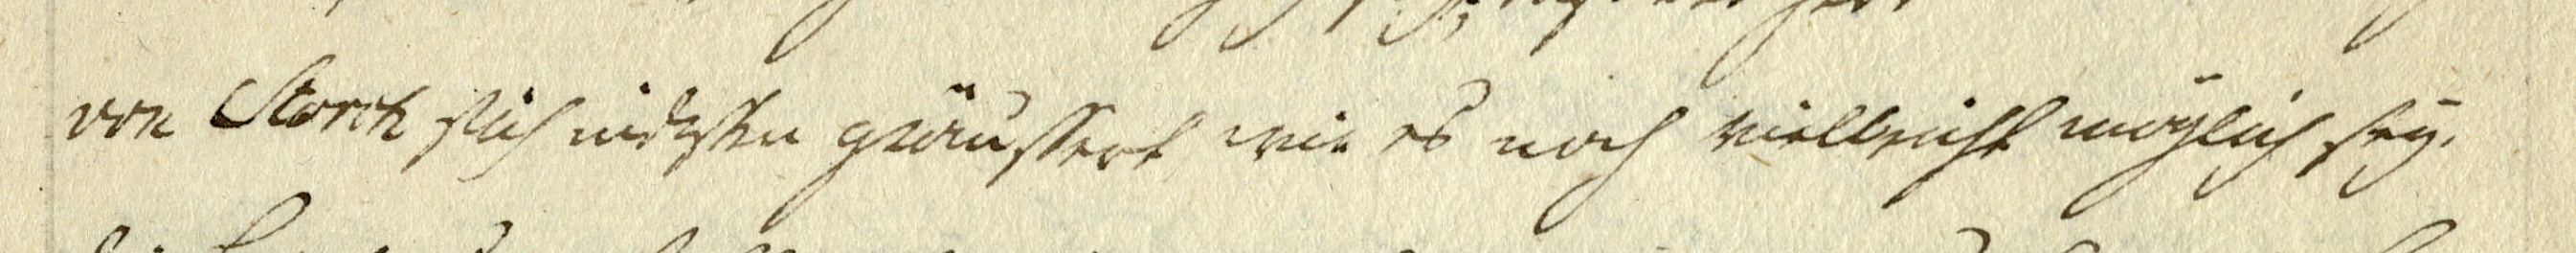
von Storch sich indessen geäussert wie es noch vielleicht möglich seÿ,
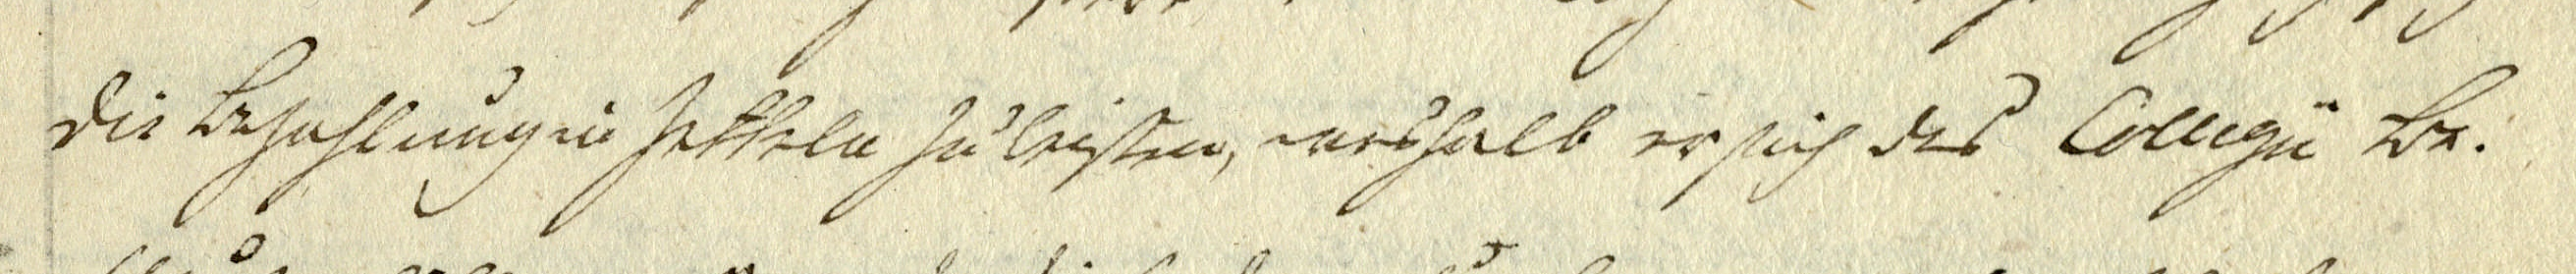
die Bezahlung in Zetteln zu leisten, weshalb er sich des Collegii Be¬
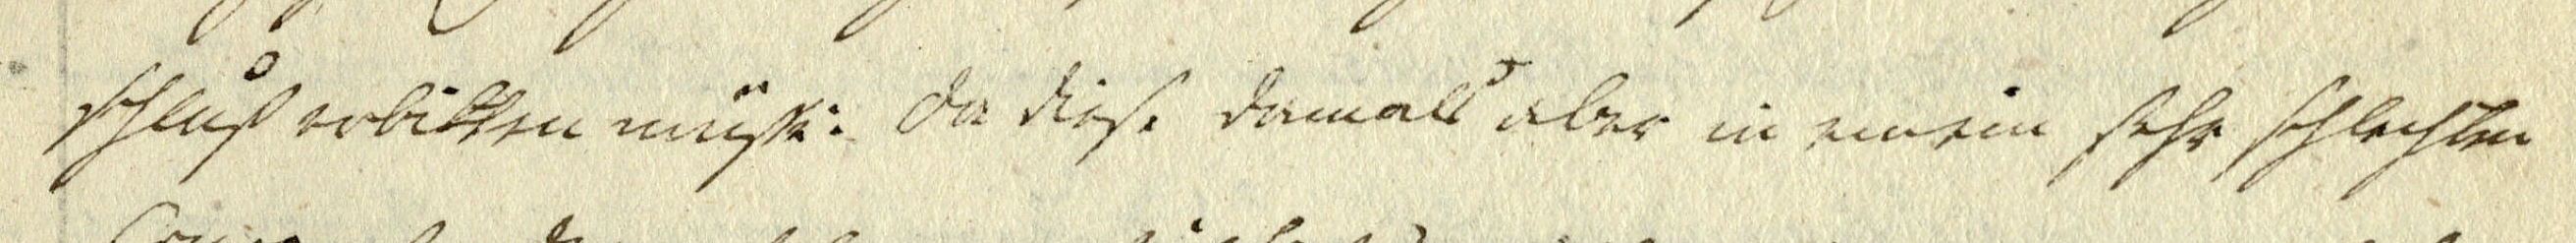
schluß erbitten müsse. Da diese damals aber in einem sehr schlechten
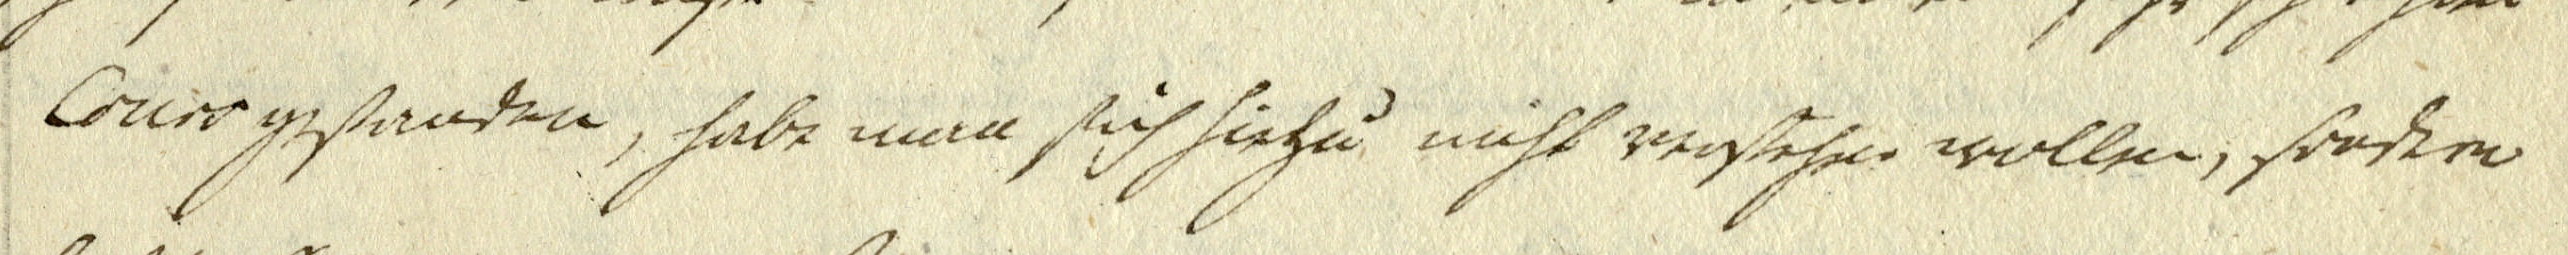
Cours gestanden, habe man sich hiezu nicht verstehen wollen, sondern
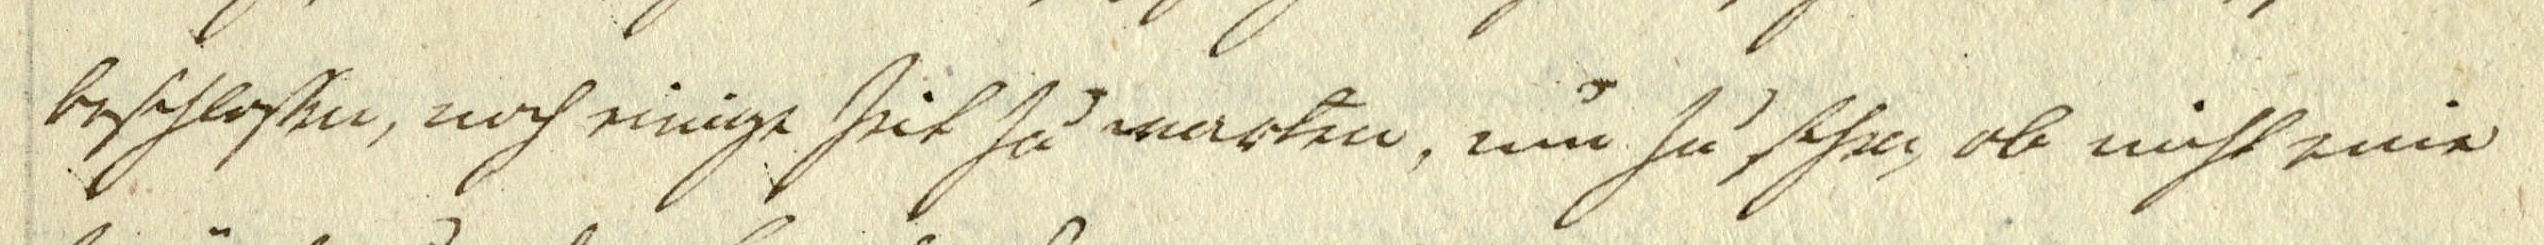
beschlossen, noch einige Zeit zu warten, um zu sehen, ob nicht eine
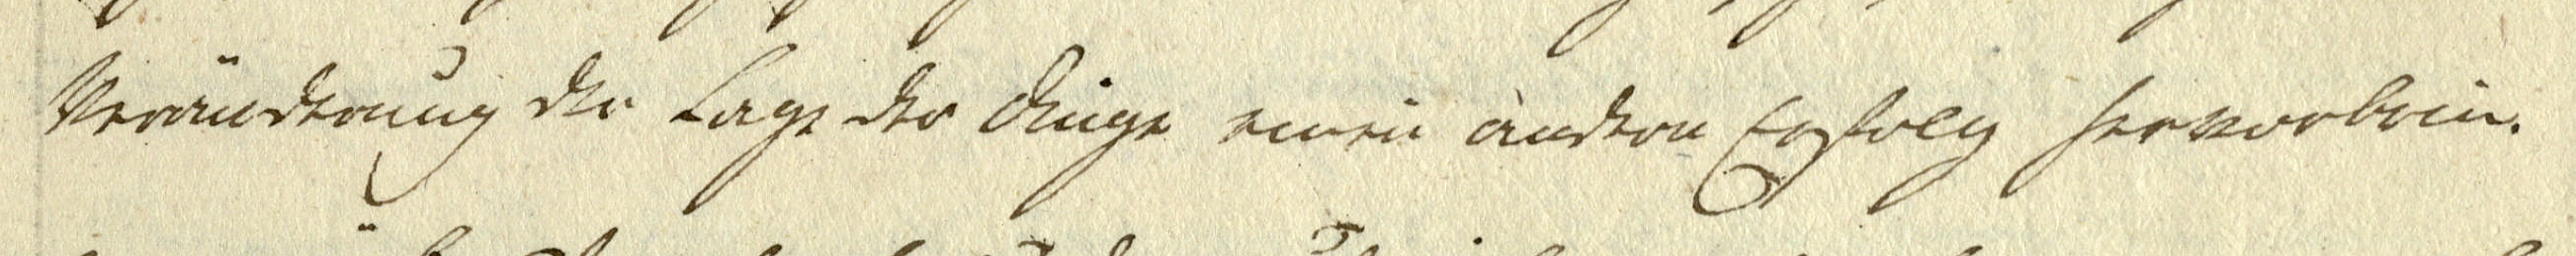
Veränderung der Lage der Dinge einen andern Erfolg hervorbrin¬
